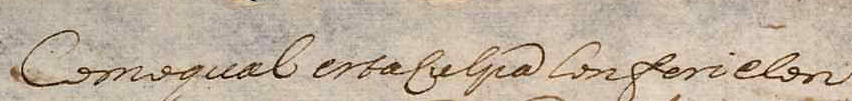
Com o qual esta Culpa conferi e con
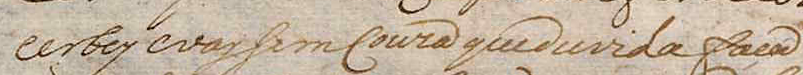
certey e vay sem Couza que duvida faça
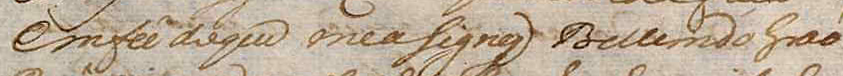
em feé do que me asignej Bellem do Graõ
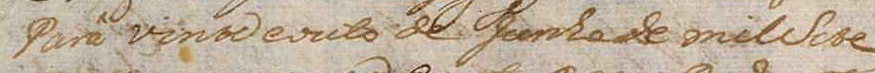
Parâ vinte e outo de Junho de mil Sete
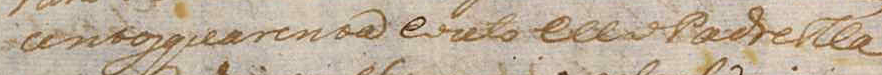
centos quarenta e outo eu o Padre Ma
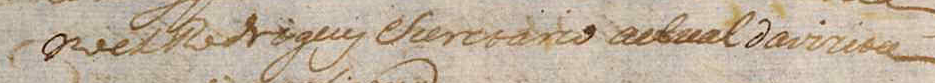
noel Rodrigues secretario actual da vizita
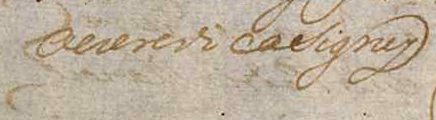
o escrevi e asigney
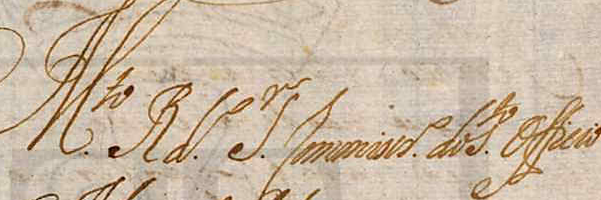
M.to Rd.o S.r Commisr.o do S.to Officio
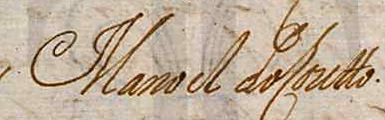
Manoel do Coutto.
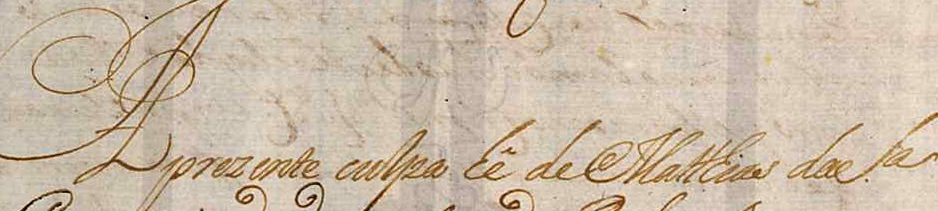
A prezente culpa hé de Matthias da S.a
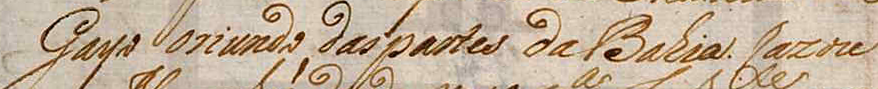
Gayo oriundo das partes da Bahia. Cazou
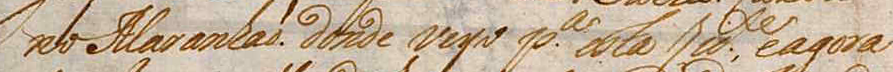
no Maranhaõ donde veyo p.a esta Cid.e e agora
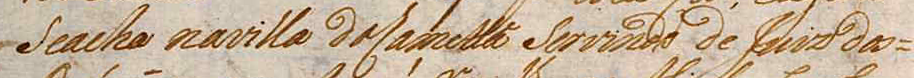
Se acha na villa da Camettâ servindo de Juiz dos
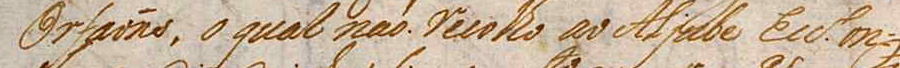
Orfaons, o qual naõ recolho ao Aljube Ecc.o on
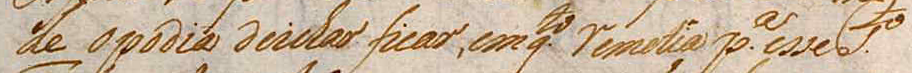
de o podia deichar ficar, emq̄to remetia p.a esse s.to
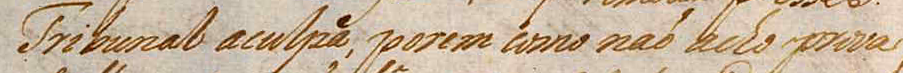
Tribunal a culpa, porem como naõ acho prova
